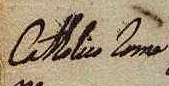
Catholico Roma
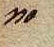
no
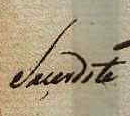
Saçerdote
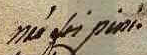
naõ foi pini
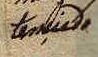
tençiado
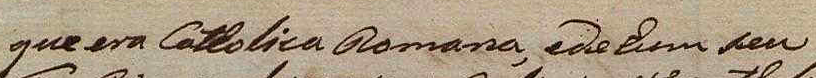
que era Catholica Romana, e de hum seu
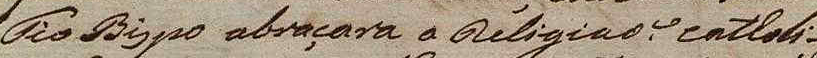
Tio Bispo abraçara a Religiaõ catholi
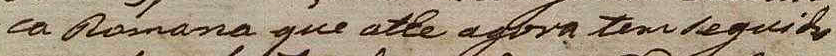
ca Romana que athe agora tem seguido
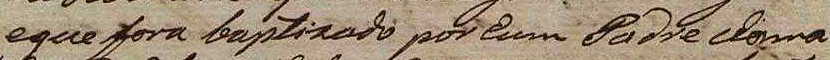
e que fora baptizado por hum Padre chama
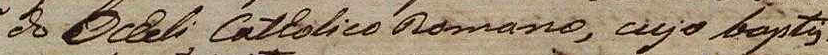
do Ocheli, Catholico Romano, cujo baptis
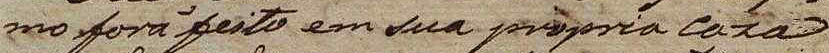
mo fora feito em sua propria caza
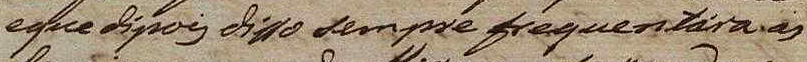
e que dipois disso sempre frequentara as
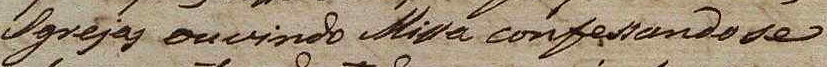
Igrejas ouvindo Missa confessandose
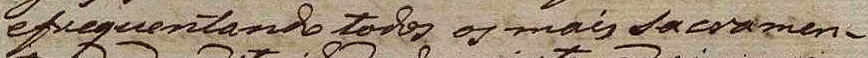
e frequentando todos os mais sacramen
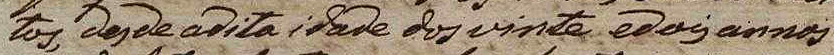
tos, desde a dita idade dos vinte e dois annos
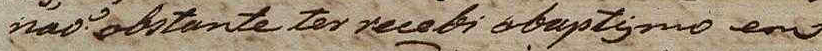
naõ obstante ter recebi o baptimo em
